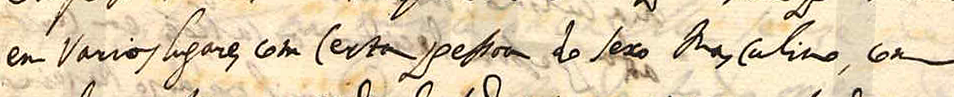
em Varios lugares com Certa pessoa do sexo Masculino, com
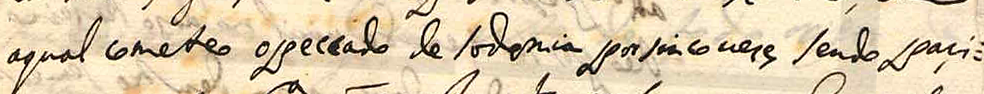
a qual cometeo o peccado de sodomia por sinco uezes sendo paçi
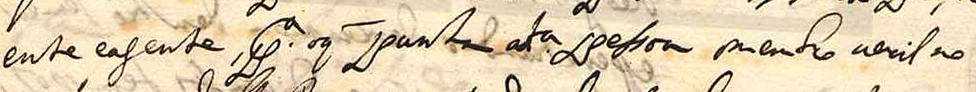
ente e agente, p.a o q̄ punha a d̄a pessoa menbro ueril no
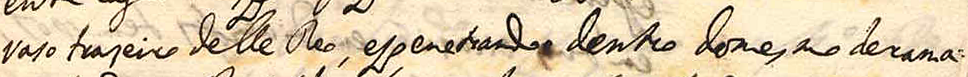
vaso trazeiro delle Reo, e penetrando dentro do mesmo derama
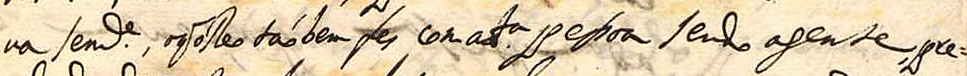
ua semt.e, o q̄ o Reo taõbem fes com a d̄a pessoa sendo agente, pre
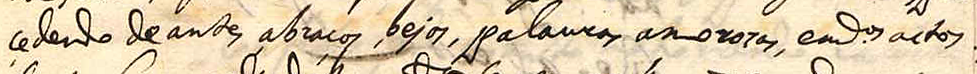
çedendo de antes abraços, bejos, palauras amorozas, e m.os actos
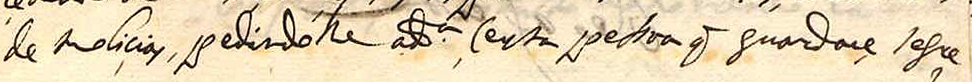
de moliçias, pedindolhe a d̄a Certa pessoa q̄ guardaçe segre
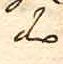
do
